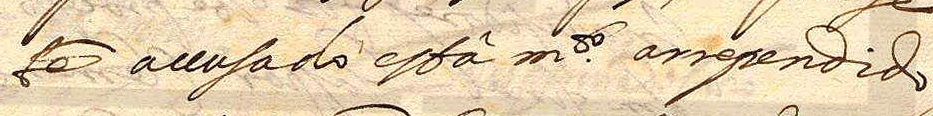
tē accusado está m.to arrependido
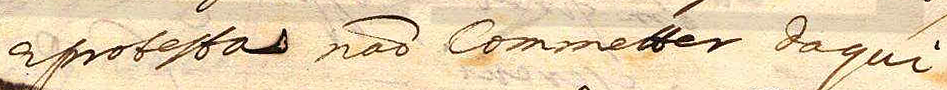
E protesta não commetter daqui
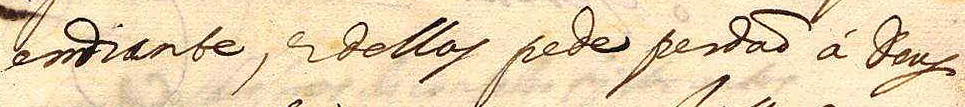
em diante, E dellas pede perdaõ á Deus
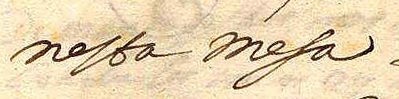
nesta mesa
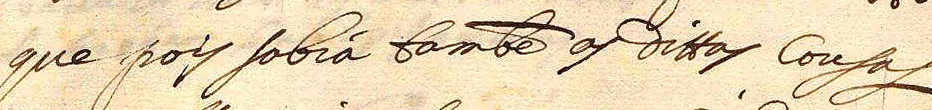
que pois sabia tambē as dittas cousas
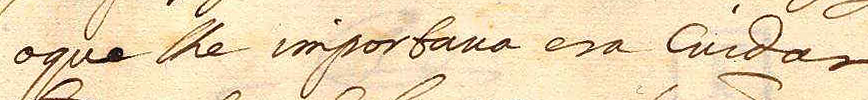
o que lhe importaua era cuidar
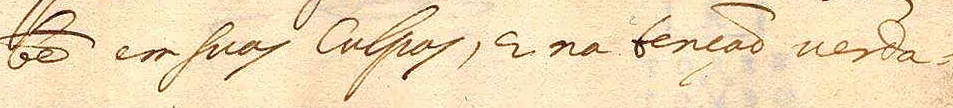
bē em suas culpas, e na tençaõ uerda
